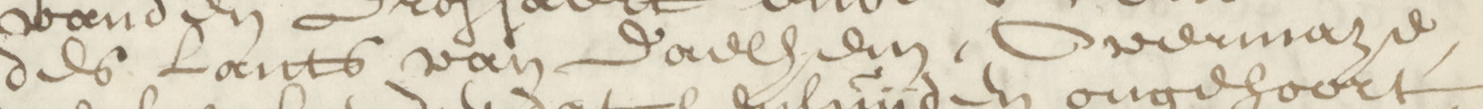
des Lants van Daelhem, Overmaze,
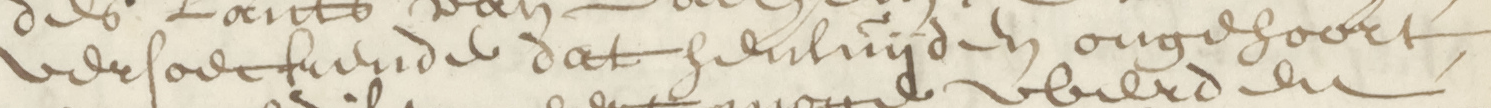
versoeckende dat henluijden ongehoort,
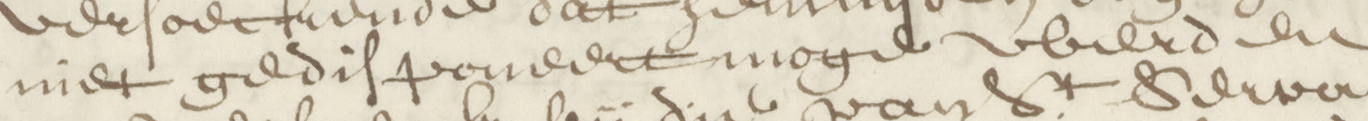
niet gedisponeert moge werden
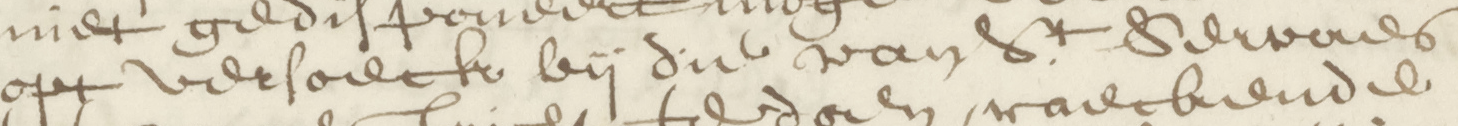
opt versoeck bij die van St. Servaes
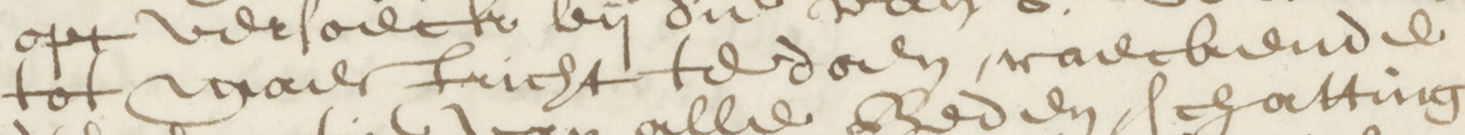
tot maestricht te doen, raeckende
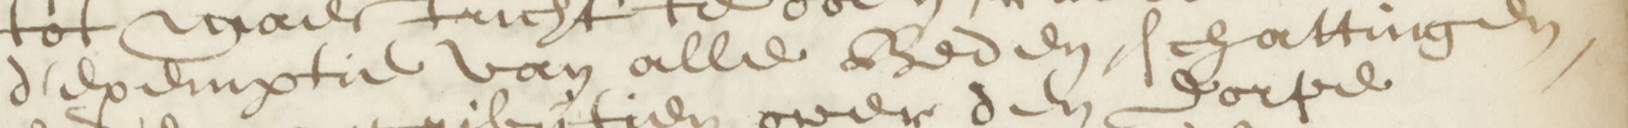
d'exemptie van alle Beden, schattingen,
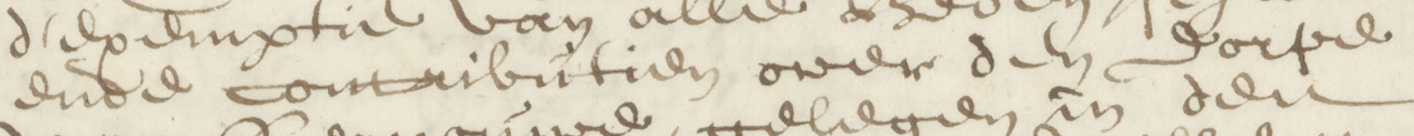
ende contributien over den Dorpe
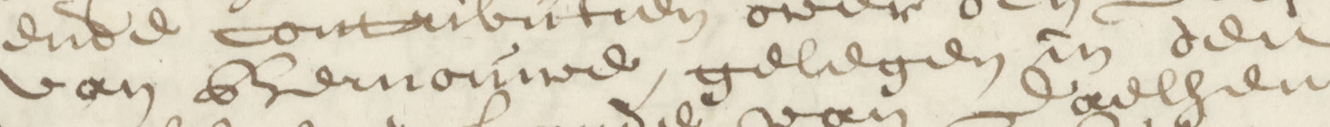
van Bernouwe, gelegen in den
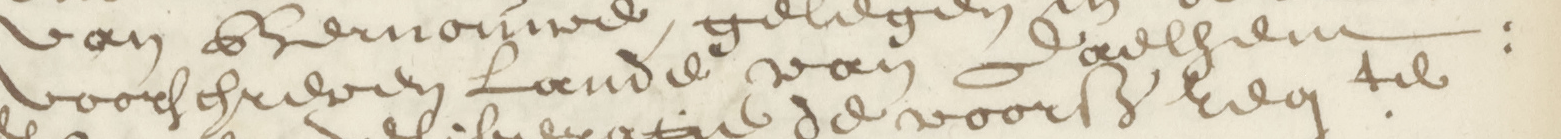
voorschreven Lande van Daelhem:
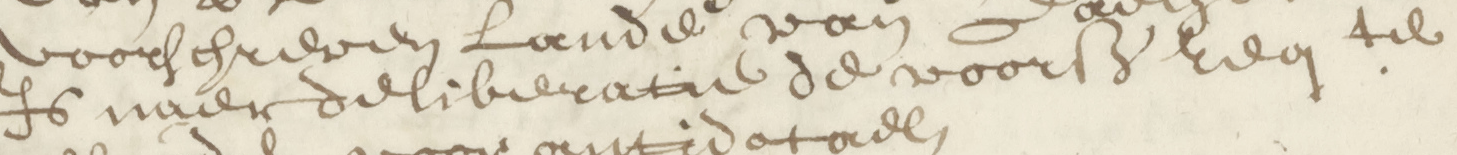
Is naer deliberatie de voors reqte.
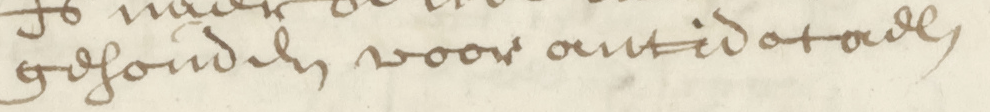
gehouden voor antidotael.
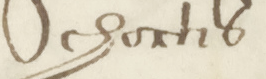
Schortes
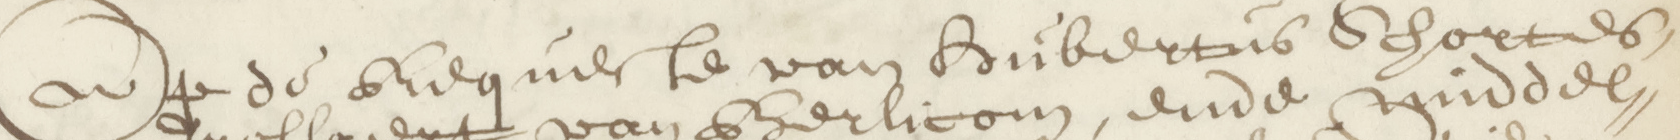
Op de Requeste van Hubertus Schortes,
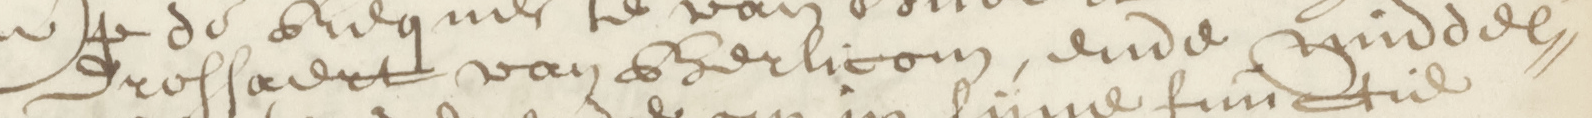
Drossaert van Berlicom, ende middel,,
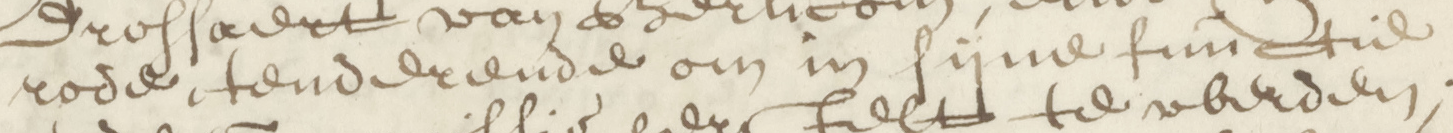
rode, tenderende om in sijne functie
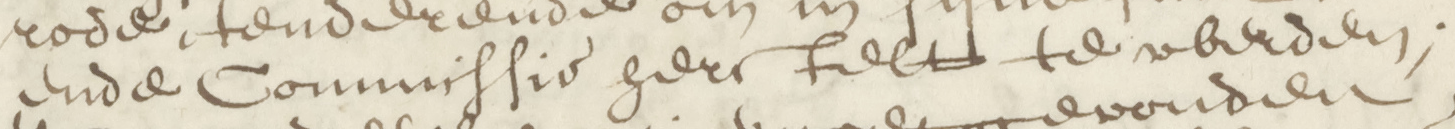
ende Commissie herstelt te werden;
